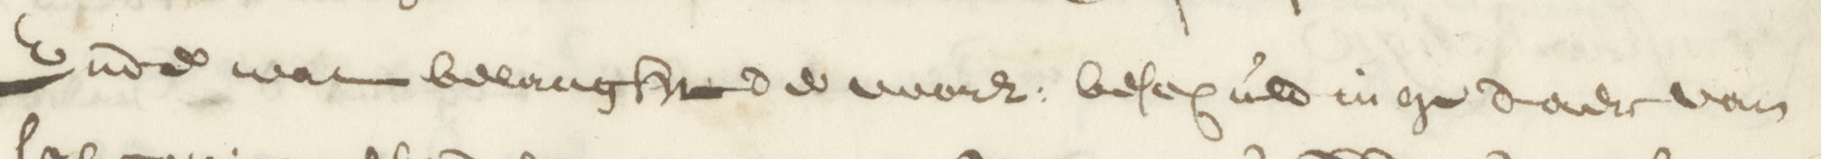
Ende wat belanght de voorz: beschulding daervan
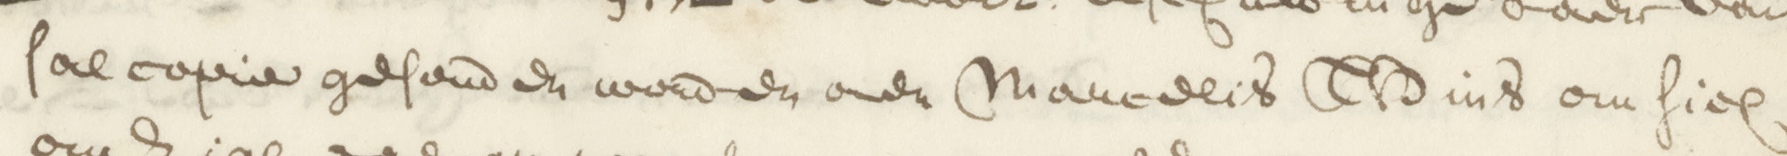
sal copie gesonden worden aen Marcelis Thins om sich
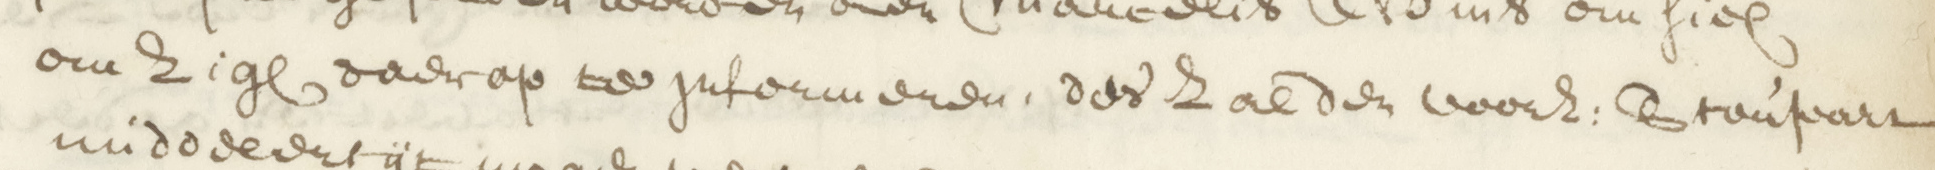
om zigh daerop te informeren, des zal den voorz: Stoupart
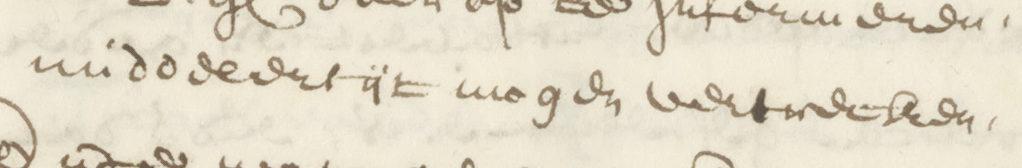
middelertijt mogen vertrecken.
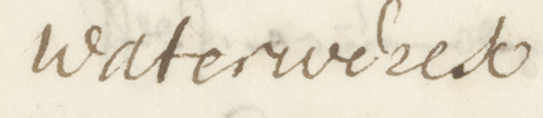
Waterwerck
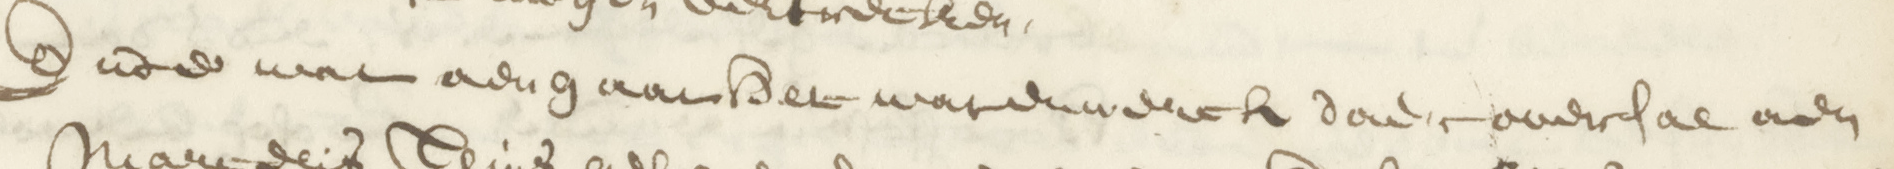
Ende wat aengaen het waterwerck daer over sal aen
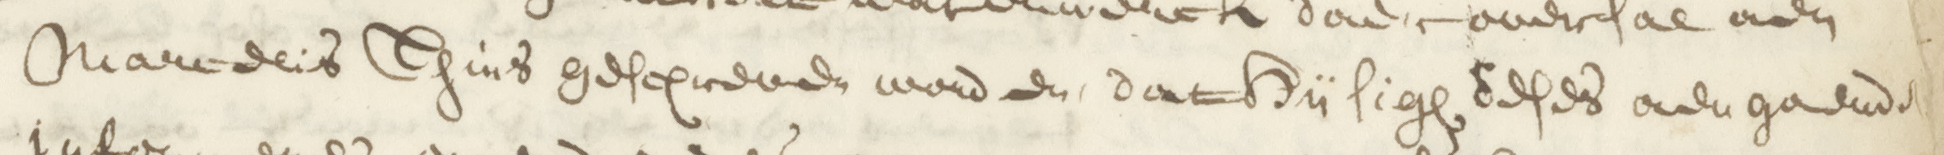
Marcelis Thins geschreven worden, dat hij sigh aengaende
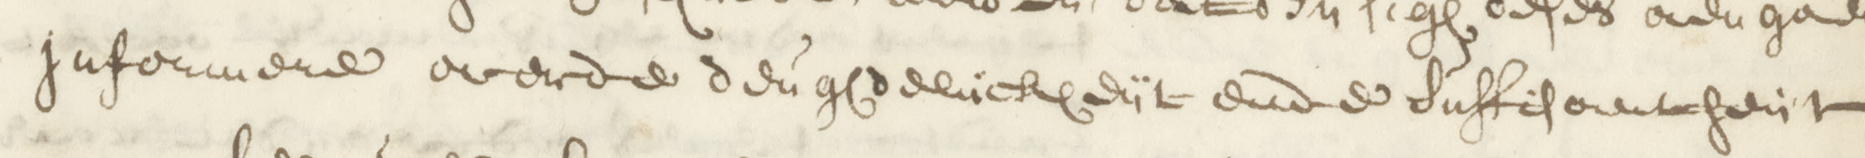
informere over de deughdelickheijt ende suffisentheijt
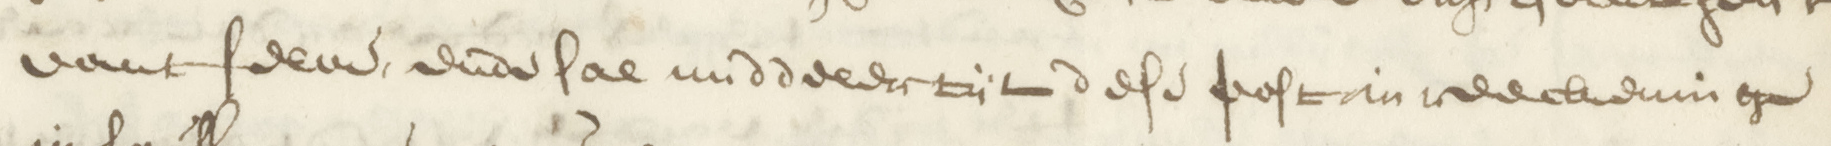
vant selve, ende sal middelertijt dese post in reeckeninge
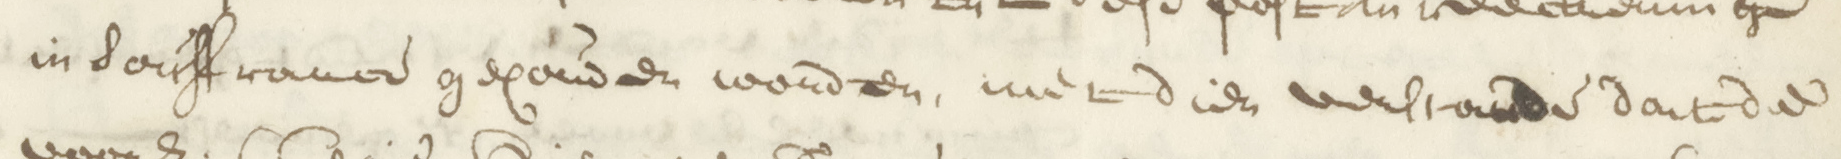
in souffrance gehouden worden, met dien verstande dat de
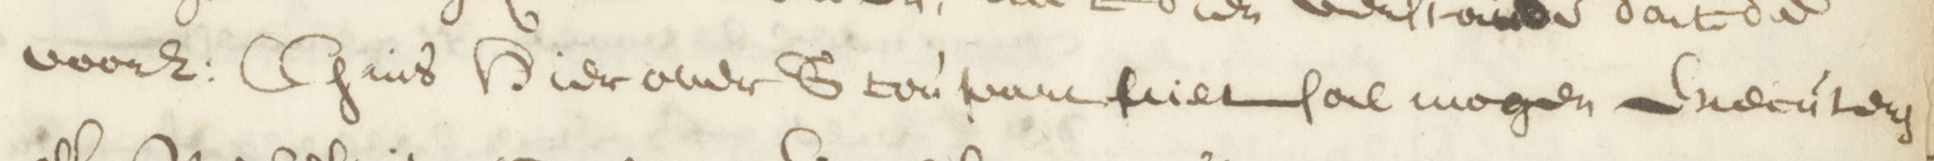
voorz: Thins hier over Stoupart niet sal mogen executeren
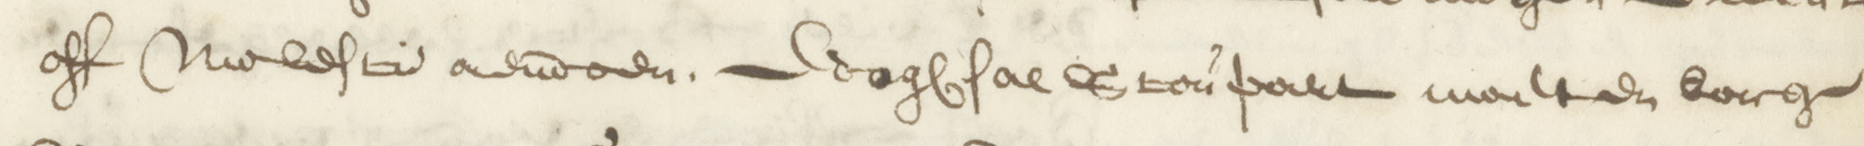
off molestie aendoen. Edoch sal Stoupart metten borge
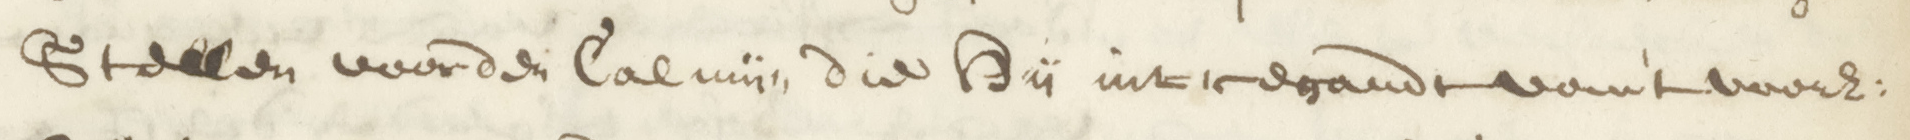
stellen voorden Calmijn die hij int regardt van 't voorz:
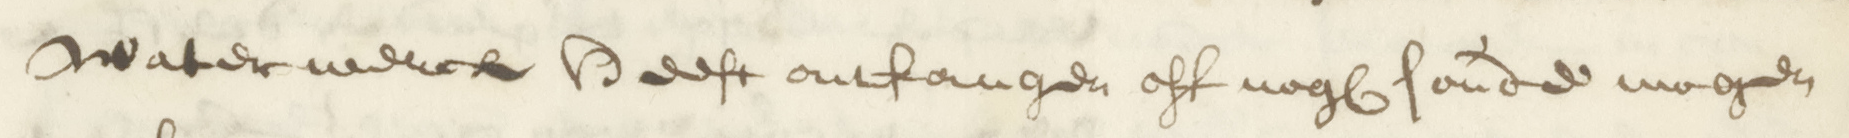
waterwerck heeft ontfangen off nogh soude mogen
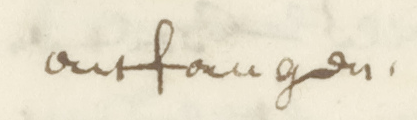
ontfangen.
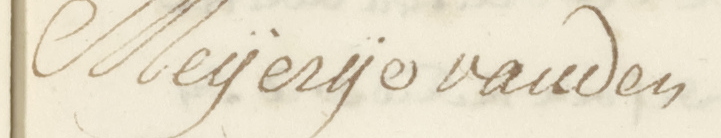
Meijerije vanden
